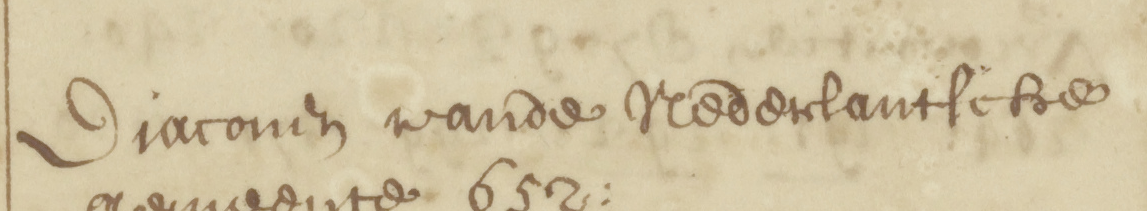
Diaconen vande Nederlantsche
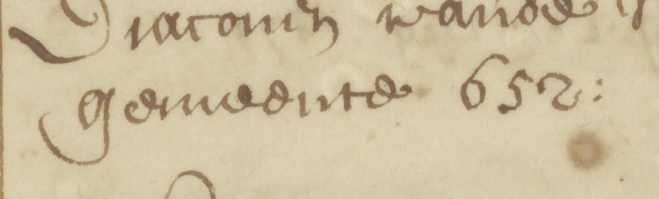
gemeente 652:
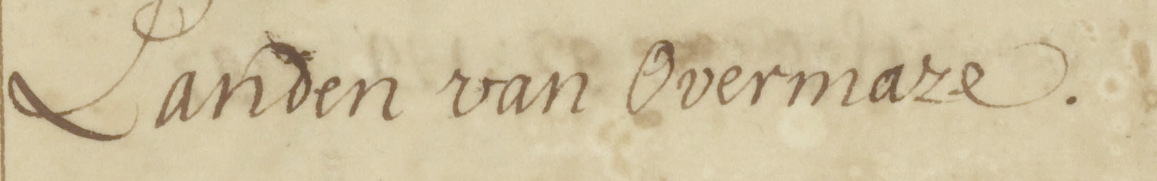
Landen van Overmaze.
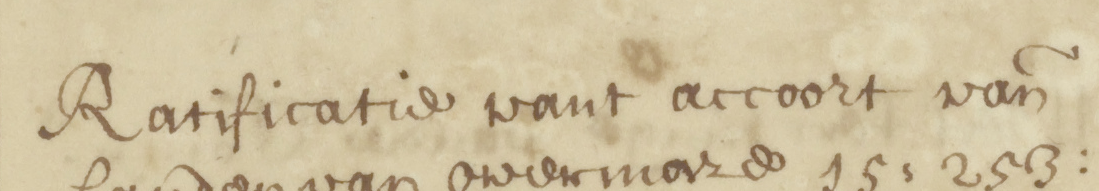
Ratificatie vant accoort van
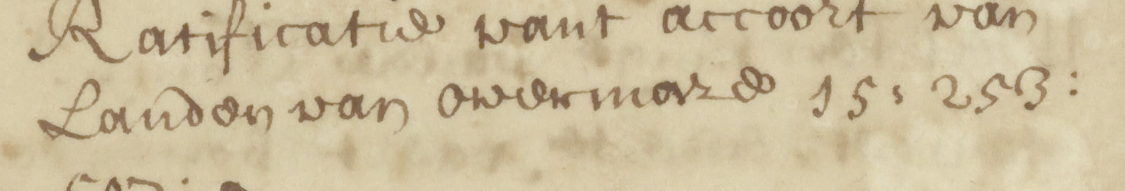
Landen van overmaze 15: 253:
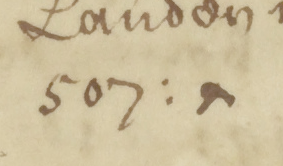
507:
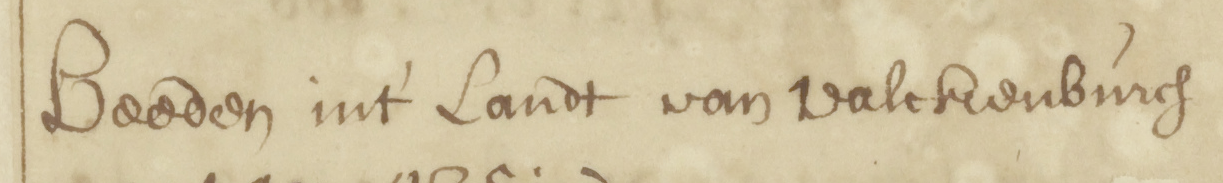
Beeden int' Landt van Valckenburch
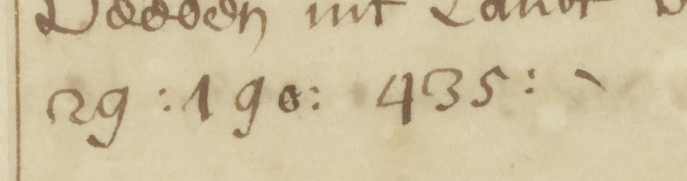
29: 190: 435:
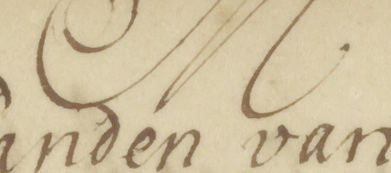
M.
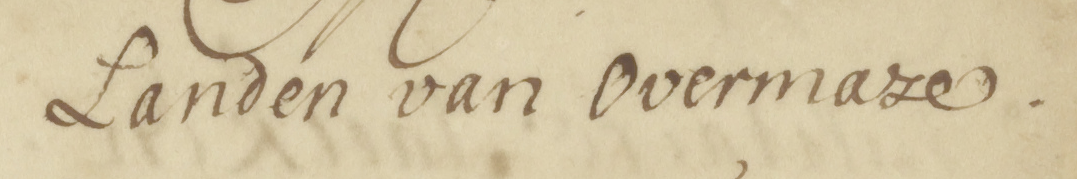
Landen van Overmaze.
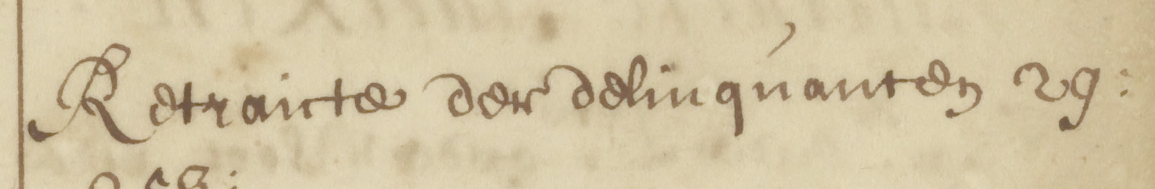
Retraicte der delinquanten 29:
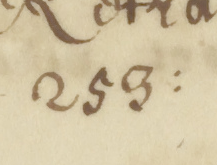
253:
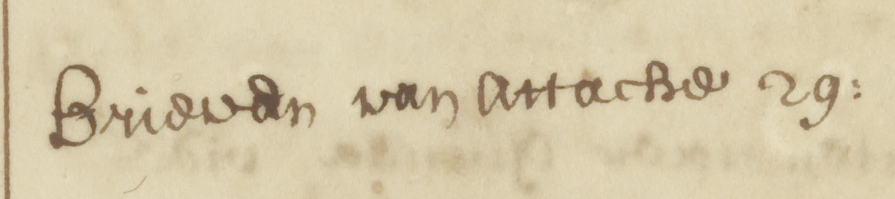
Brieven van Attache 29:
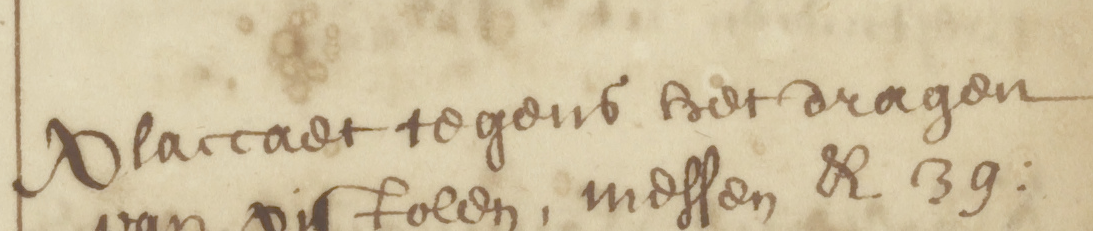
Placcaet tegens het dragen
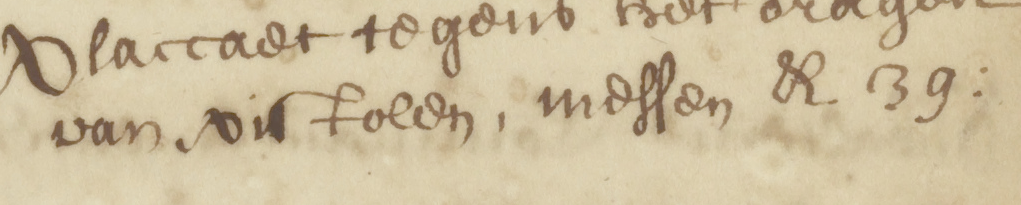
van pistolen, messen @ 39:
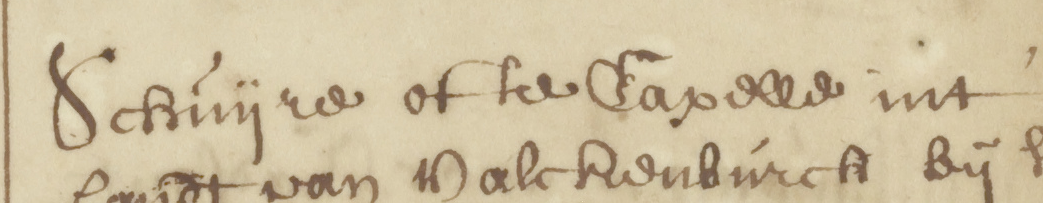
Schuijre ofte Capelle int
